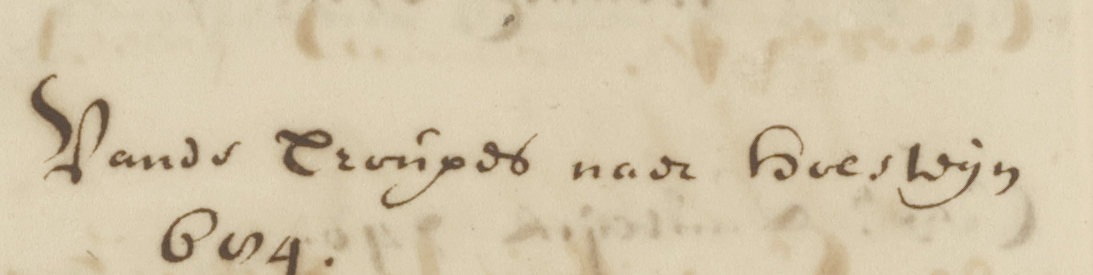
Vande Troupes naer Holsteijn
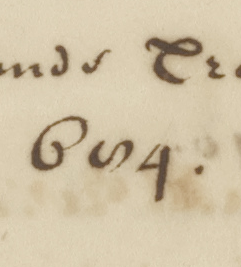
684.
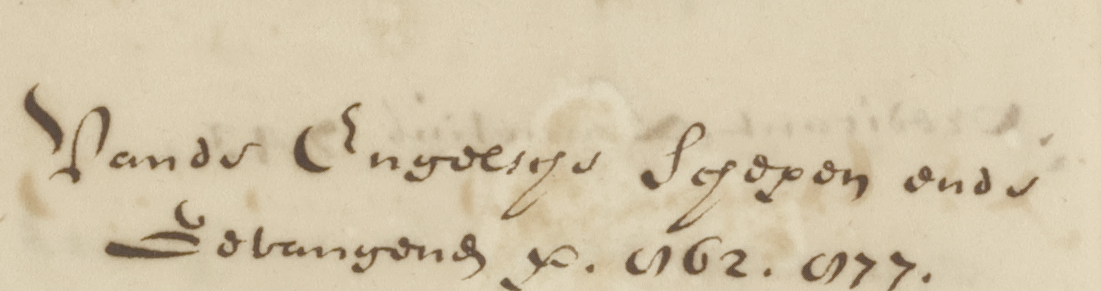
Vande Engelsche Schepen ende
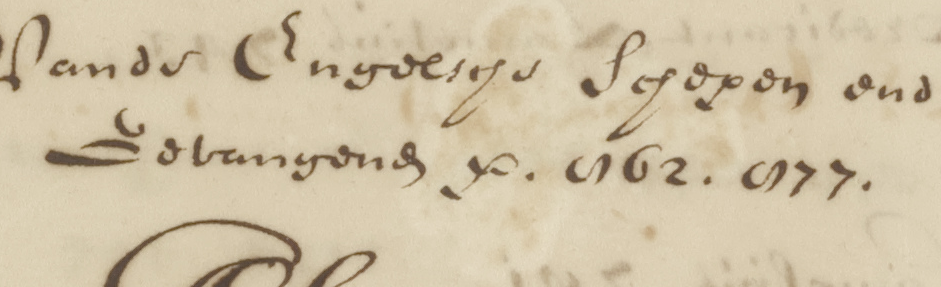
Gevangenen p. 862. 877.
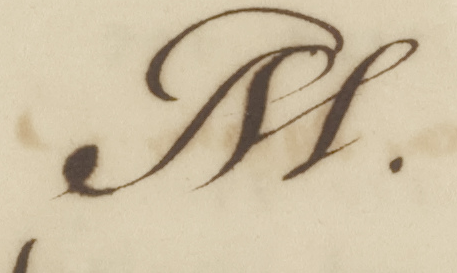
M.
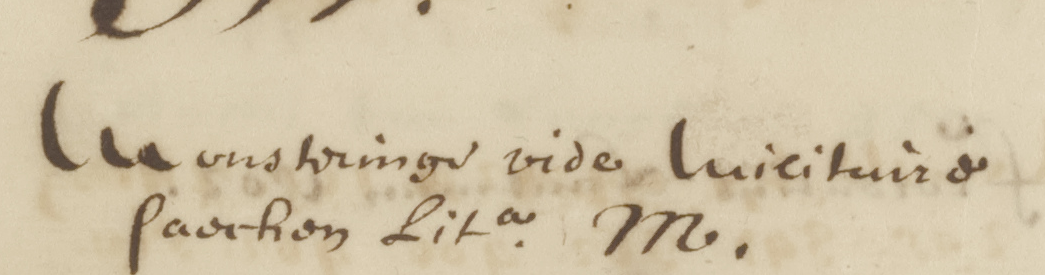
Monsteringe vide militaire
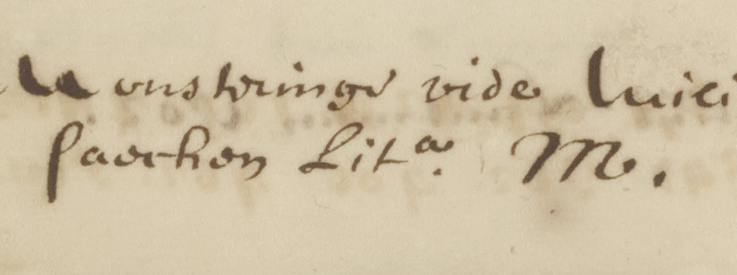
saecken Lita. M.
